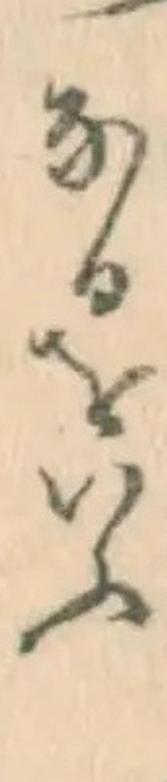なるをいふ
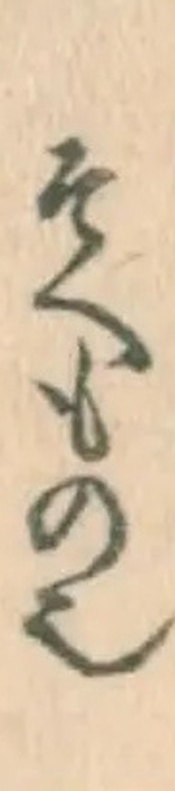そへもの也
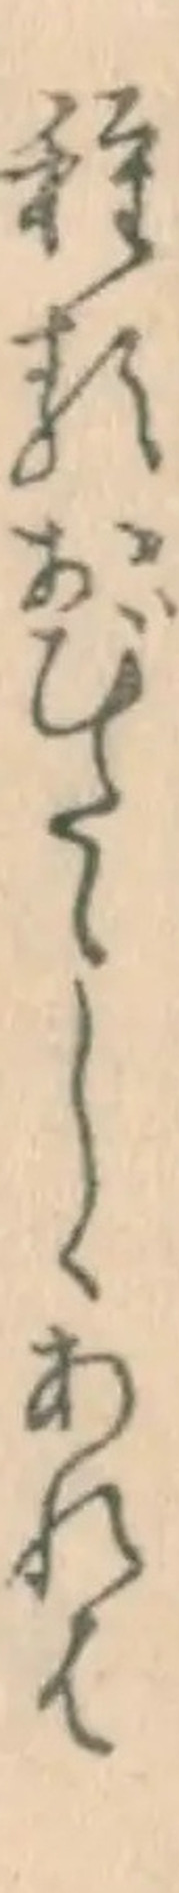菊種類おびたしくあれは
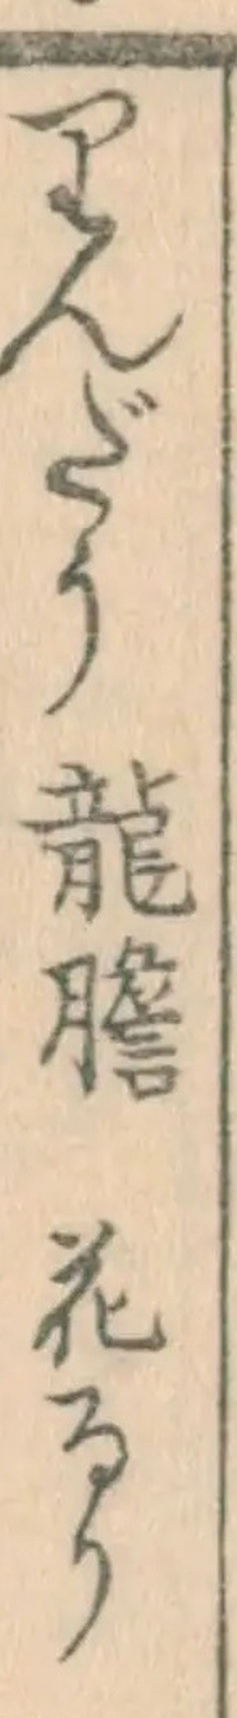りんだう龍膽花るり
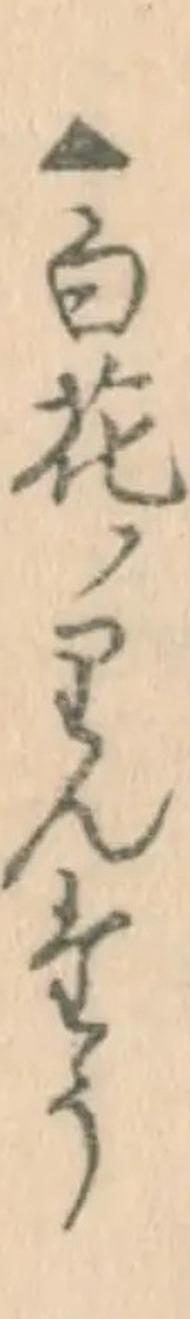▲白花ノりんたう
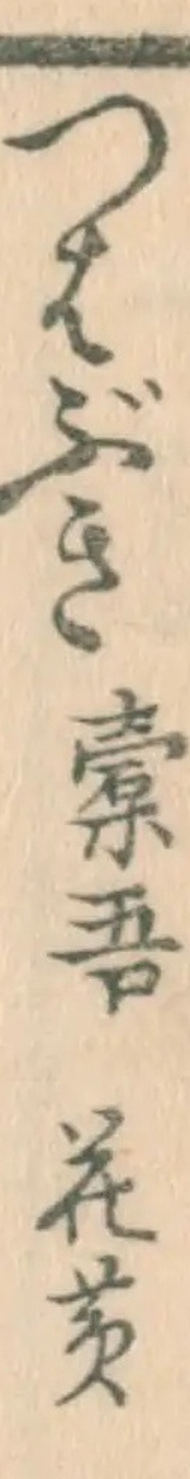つはぶき槖梧花黄
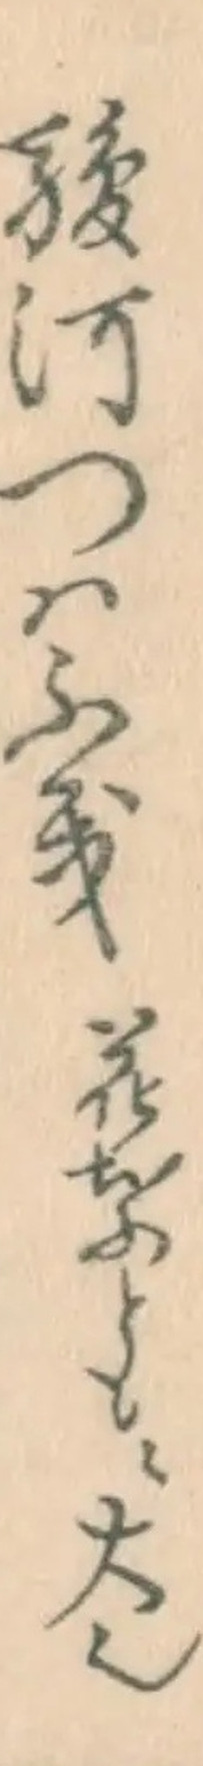駿河つはふき花葉ともニ大
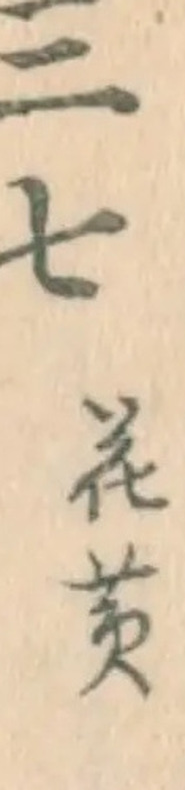三七花黄
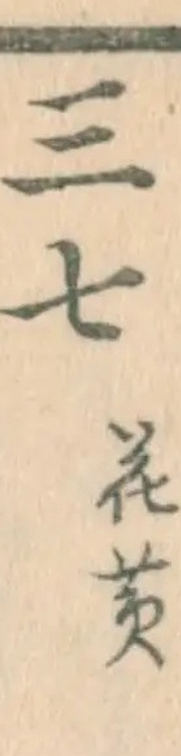三七花黄
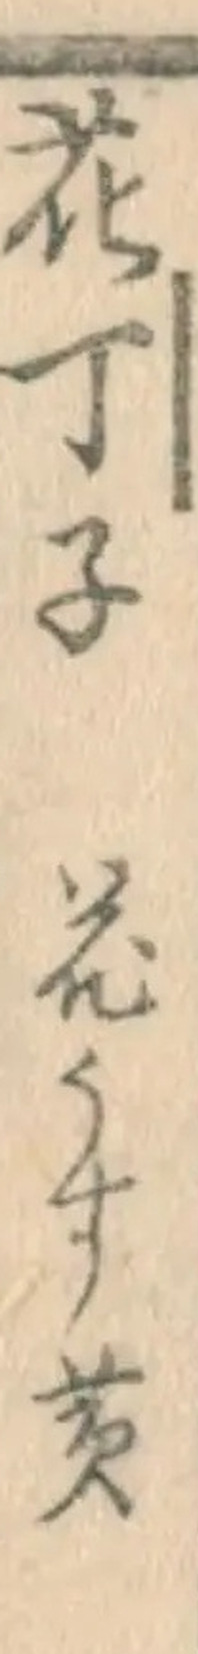花丁子花うす黄
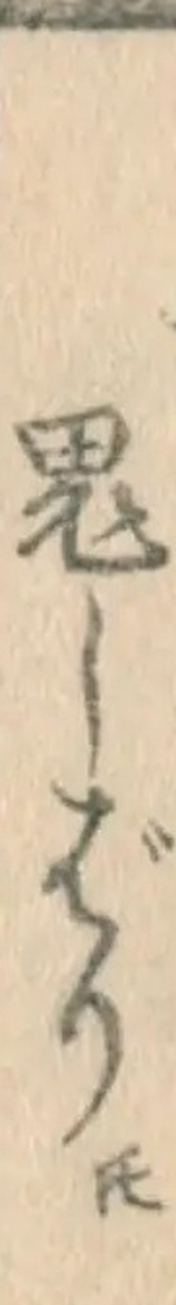鬼しばり共
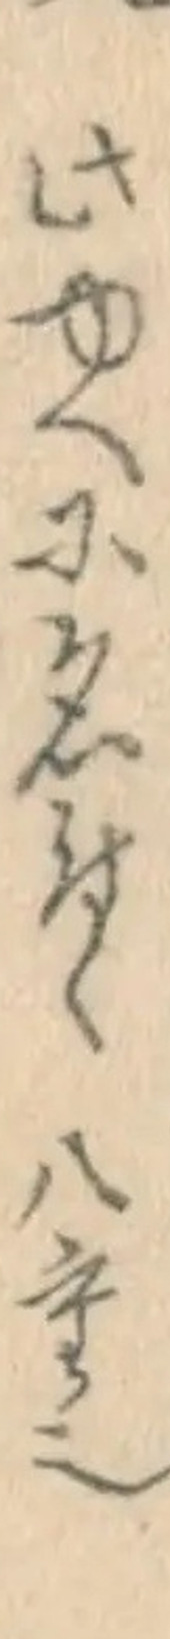此れゆへ小名付く八重也
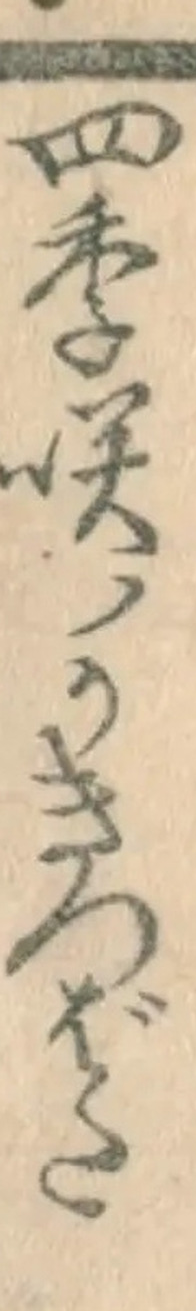四季咲のかきつばた

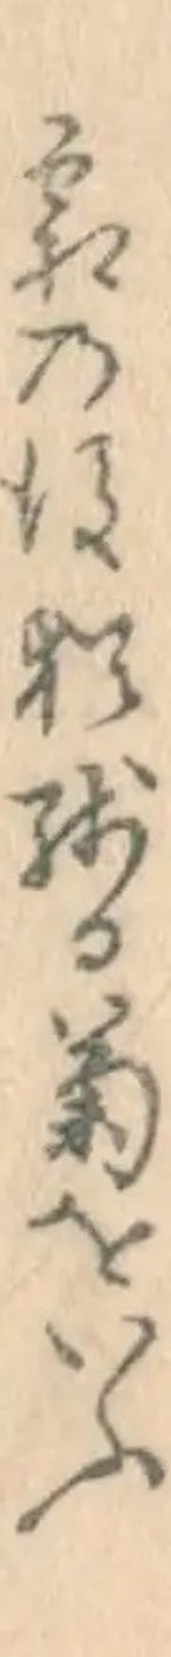霜の後猶残る菊をいふ
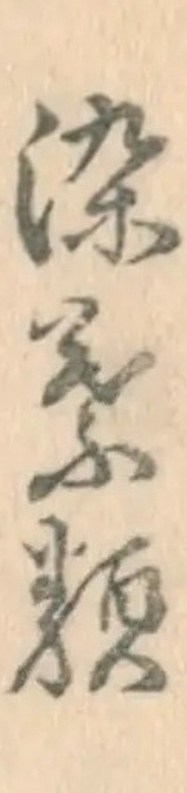染葉類
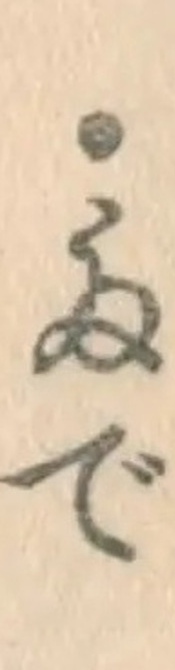●たで
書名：茶席挿花集
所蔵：国立国会図書館 National Diet Library, JAPAN
